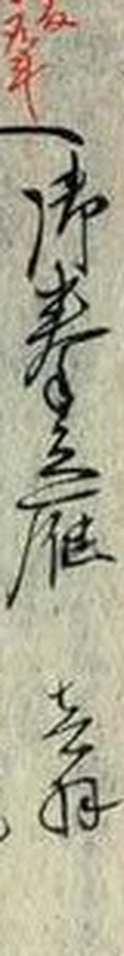御拳之雁壱羽
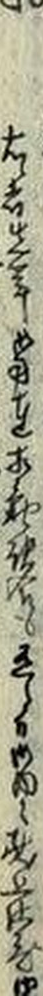右之者先年御用達相勤候訳合も有之ニ付御内々献上仕度由御台所
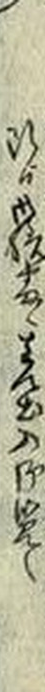頭ゟ御膳番へ差出入御覧候
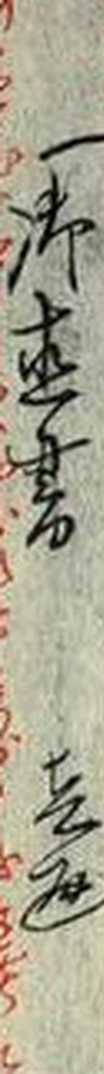御直書壱通
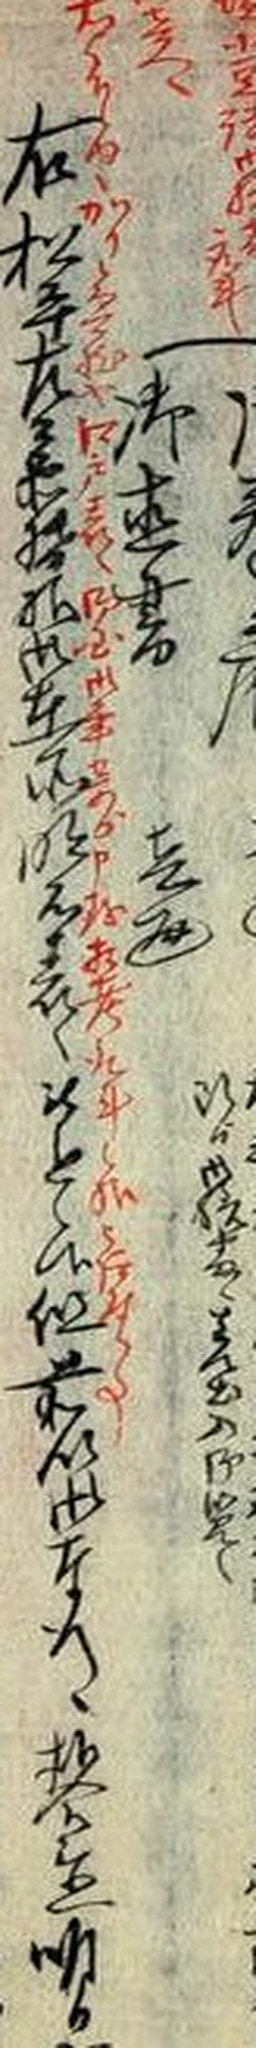右松平左兵衛督様御在所明石表へ被進候但前以御奉行へ掛合置明日町
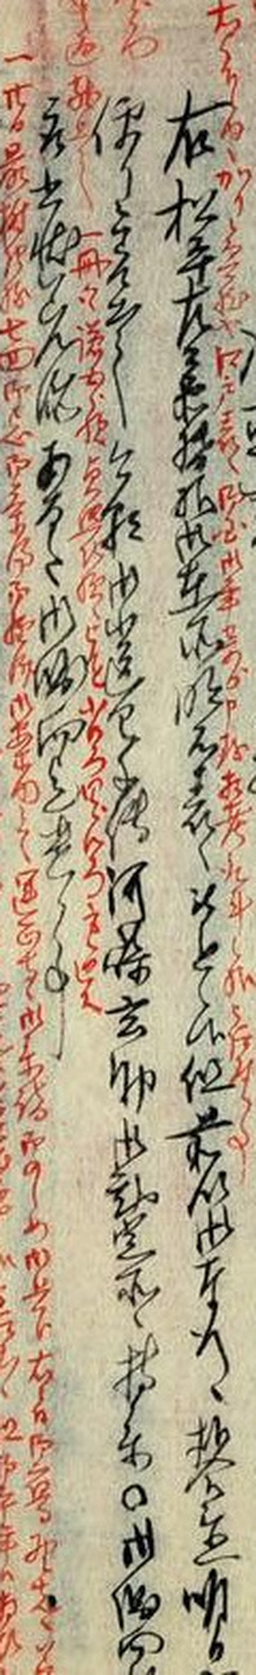便りニ差出之今朝御小道具手伝川崎玄助御勘定所へ持参〇御側向頭
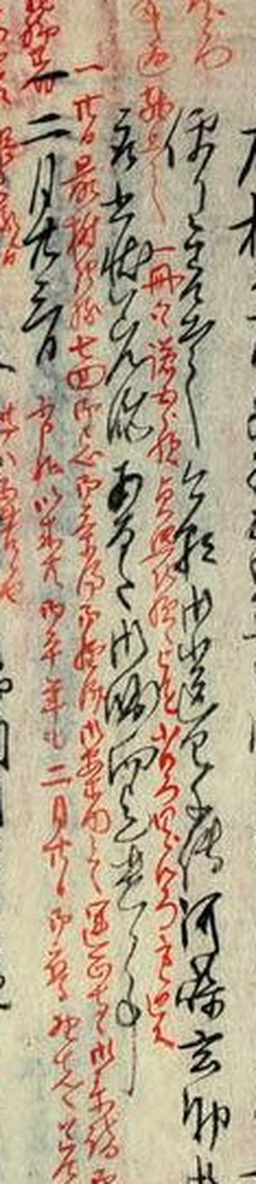取書状差添あなた御側向迄遣候事
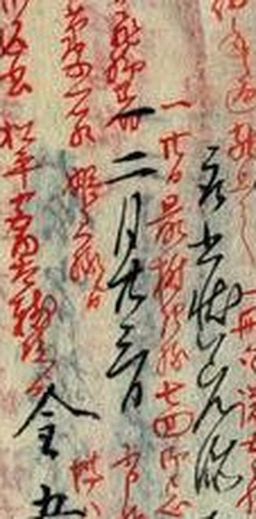一二月廿三日
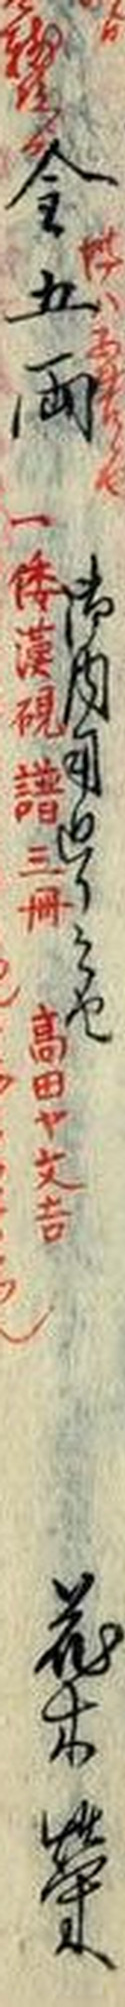金五両御内用廻り之由花木栄

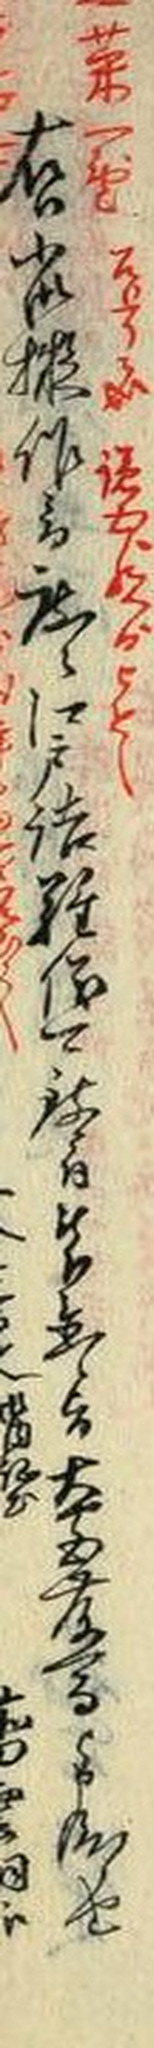右ハ小御擬作ニ而度々江戸詰難儀可致ニ付被下置候旨大宮藤馬被申渡候由
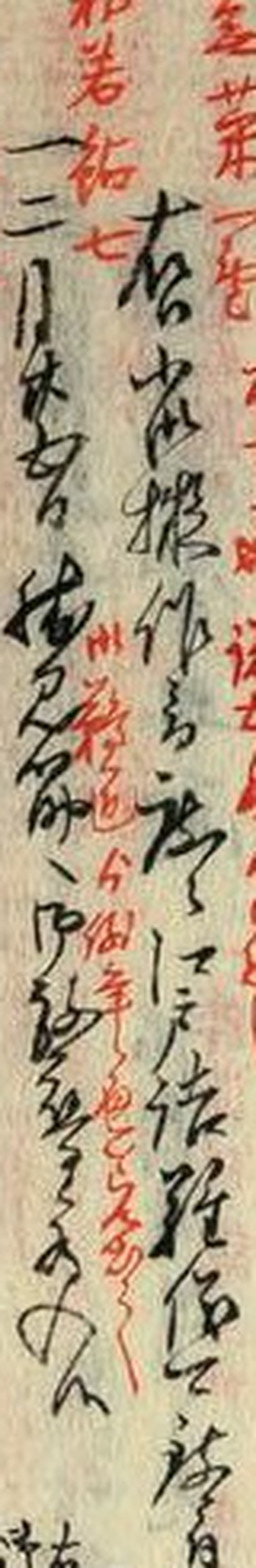一二月廿五日勝見筋へ御放鷹被為入候
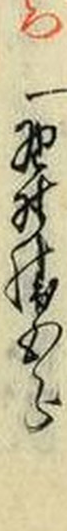野村勝五郎
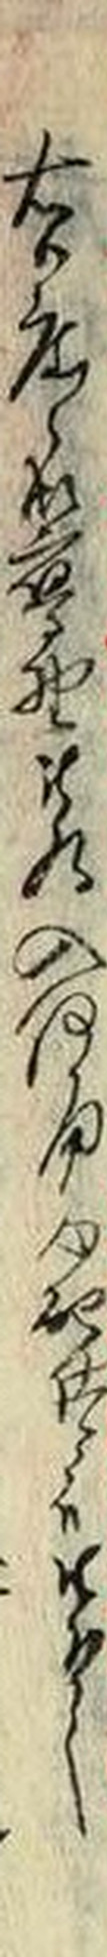右ハ度々御鷹野被為入何角心配仕候ニ付被下之
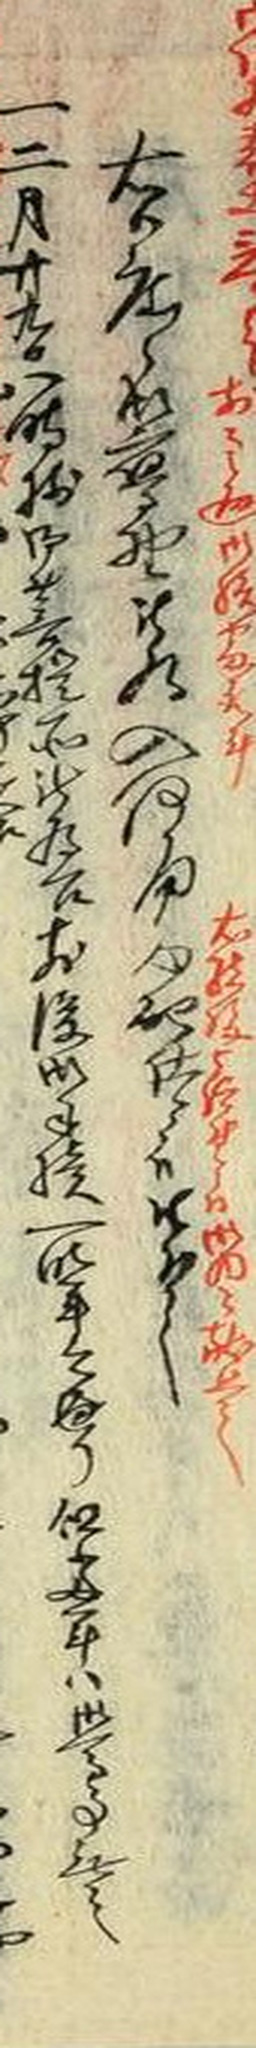一二月廿九日八時揃御菩提所被為召前後御手続一昨年之通但当年ハ御馬事無之
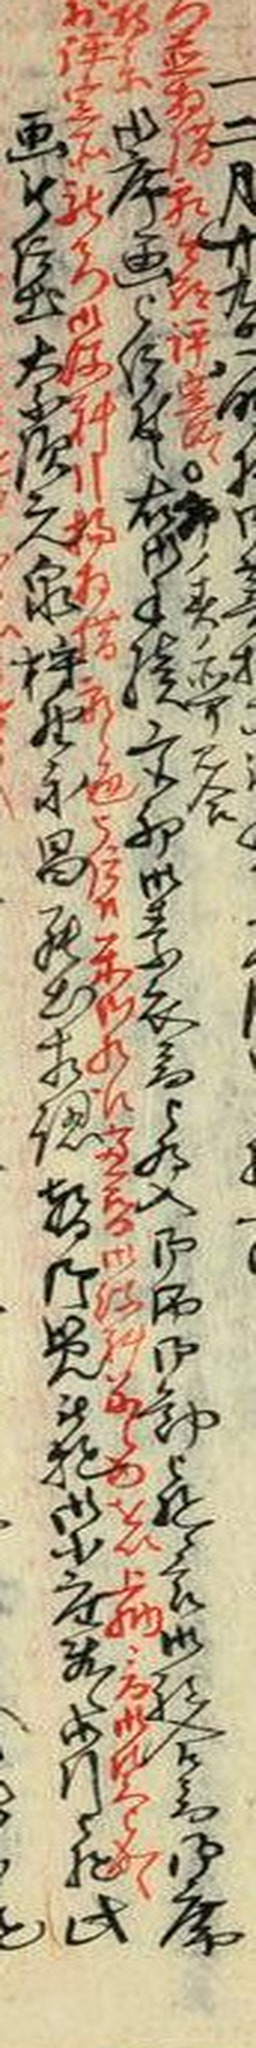画被仰出奈須元泉狩野永昌罷出相認暫御覧被遊御小座敷へ御引被遊此
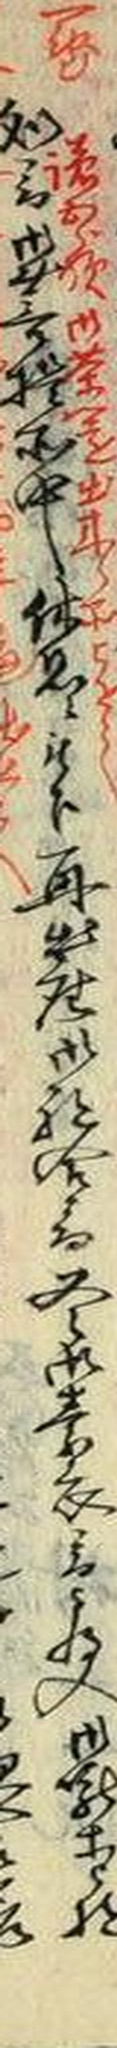処ニ而御菩提所中休息ニ被下再出座御程合ニ而又々御素衣ニ而被為入御噺等被遊
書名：少傅日録抄（斉承付側向頭取日記、在国）
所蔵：福井県文書館 Fukui Prefectural Archives
